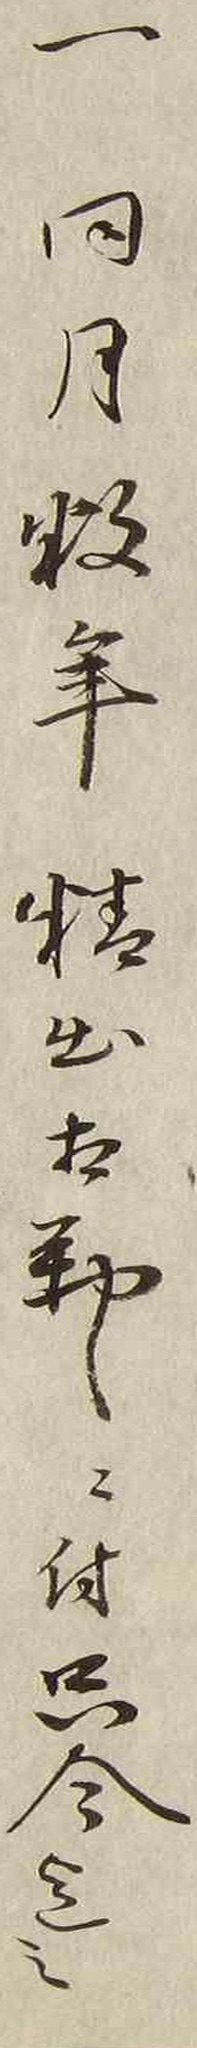一同月数年精出相勤め候ニ付き只今迄之
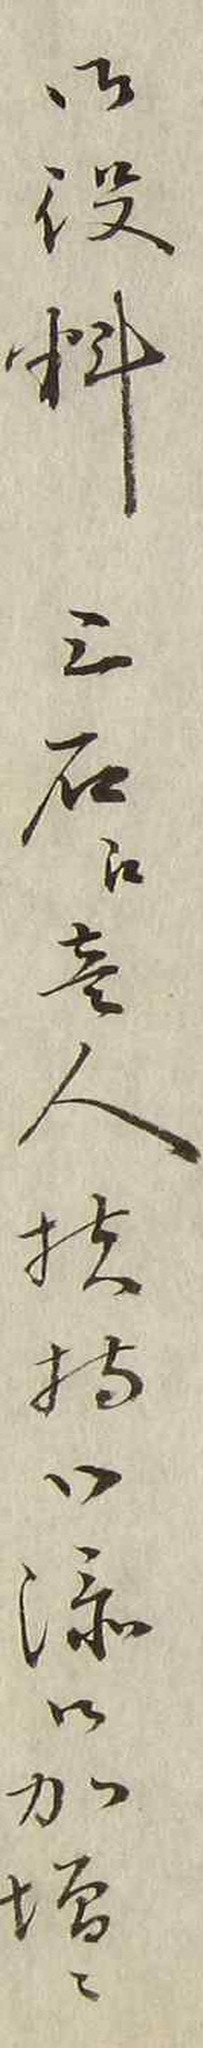御役料三石へ壱人扶持御添え御加増ニ

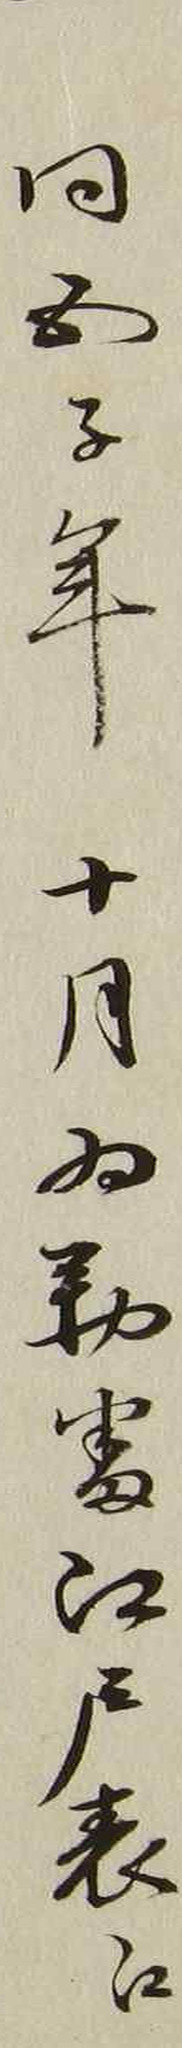一同五子十月勤番之為江戸表へ
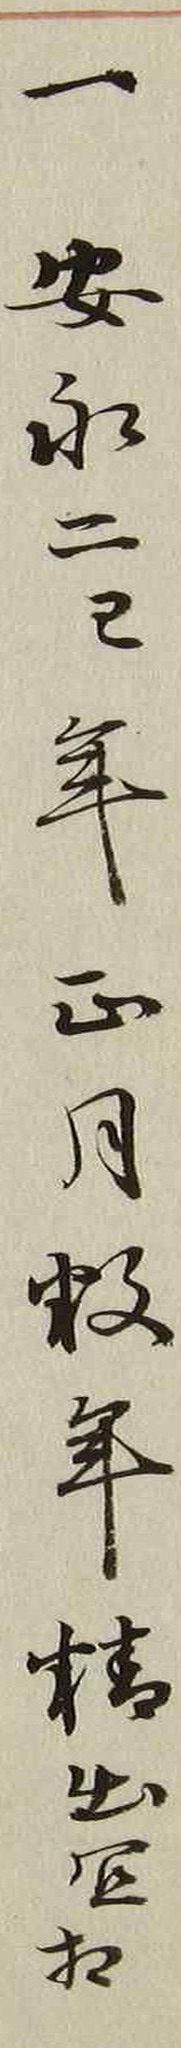一安永二巳年正月数年精出宜しく相
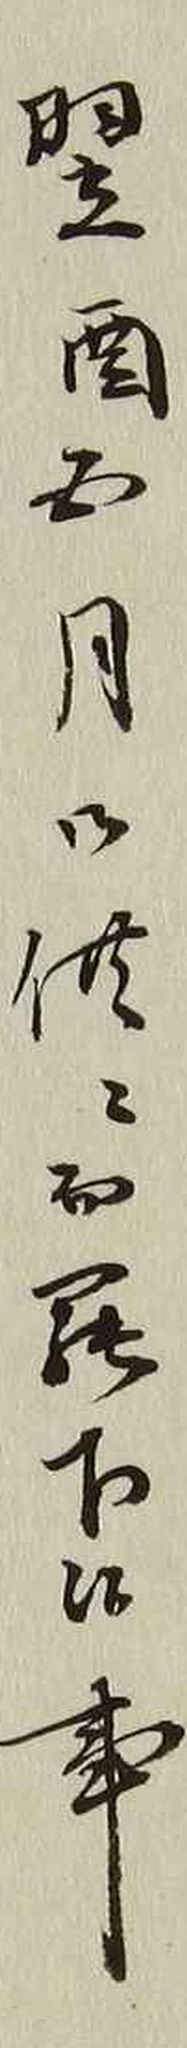翌酉五月御共ニて罷り下り候事
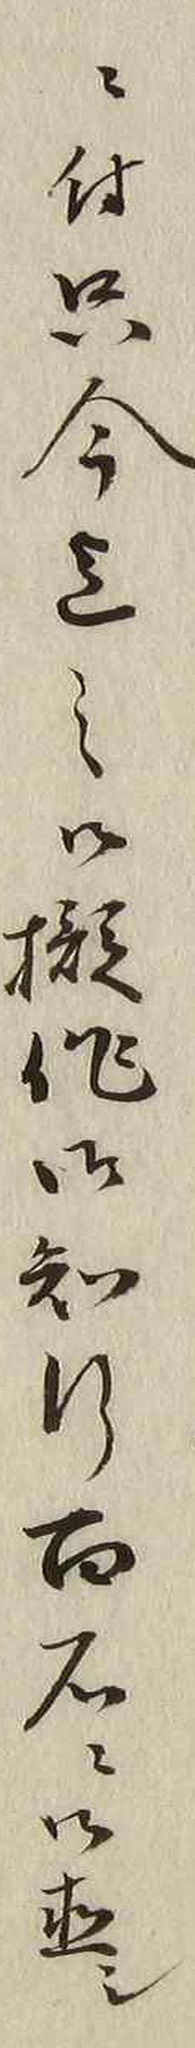ニ付き只今迄之御擬作御知行百石ニ御直シ
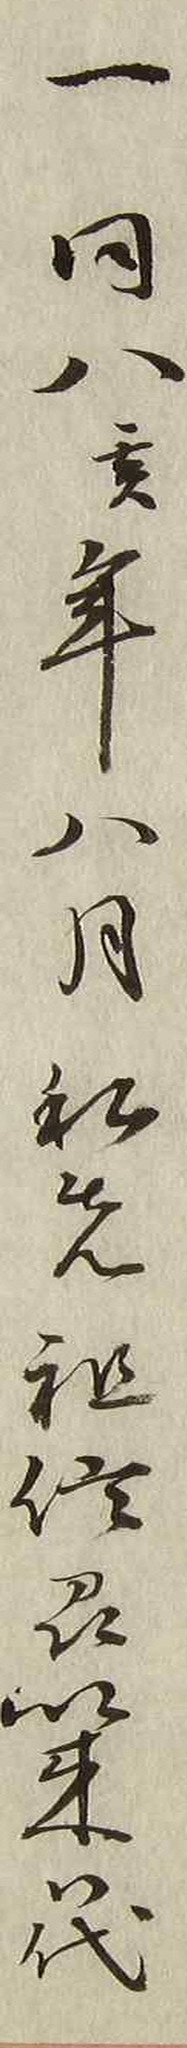一同八亥年八月私先祖信州以来御代
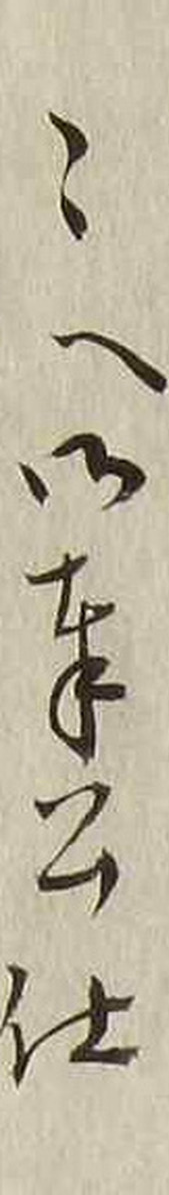々へ御奉公仕り
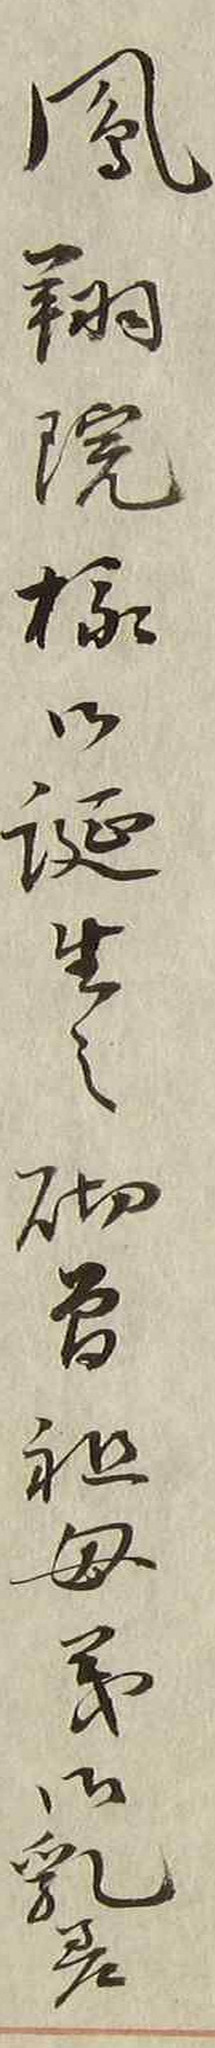鳳翔院様御誕生之砌曾祖母義御乳差し

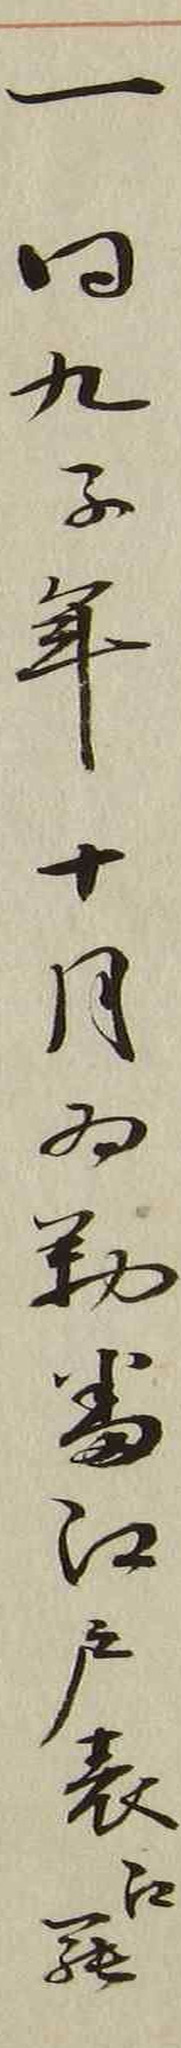一同九子年十月勤番之為江戸表へ罷り
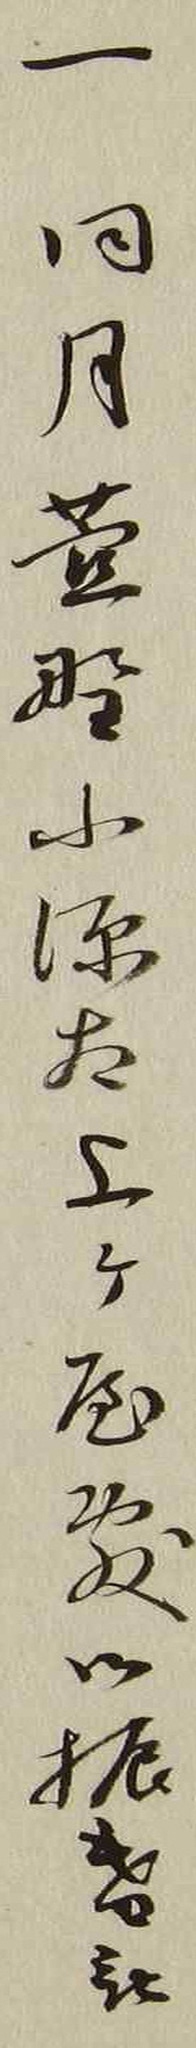一同月萱野小源太上ケ屋敷御振替
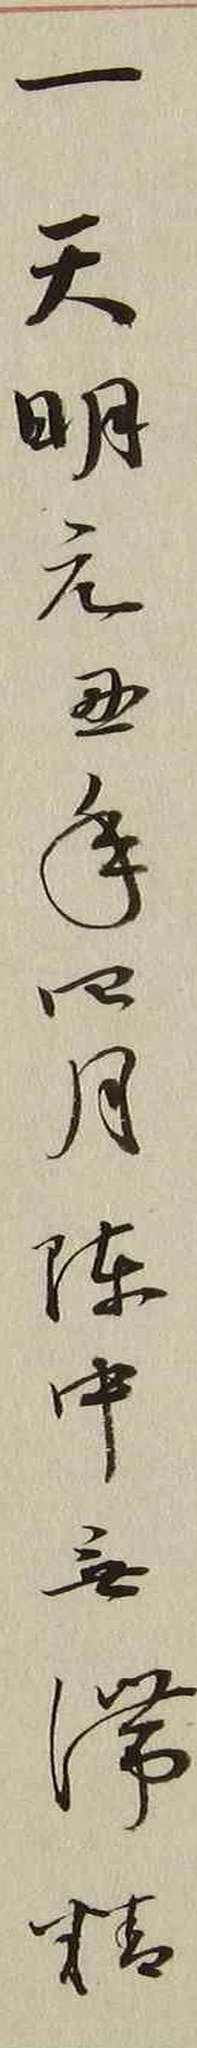一天明元丑年四月陣中滞り無く精
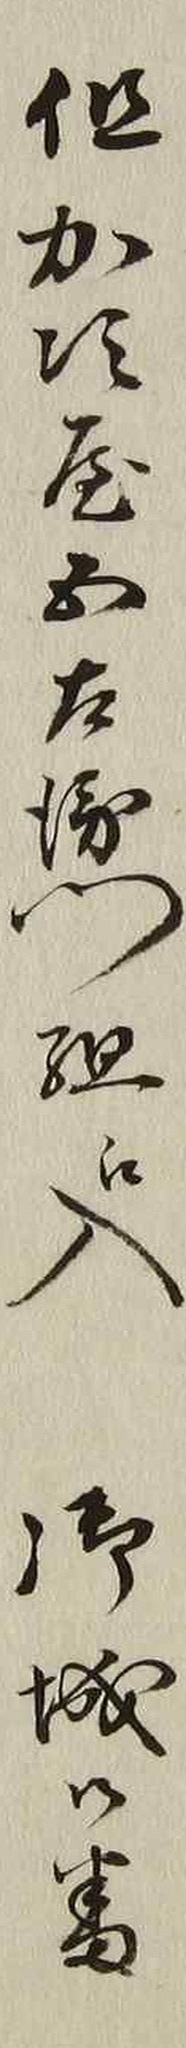但し加須屋五左衛門組へ入御城御番
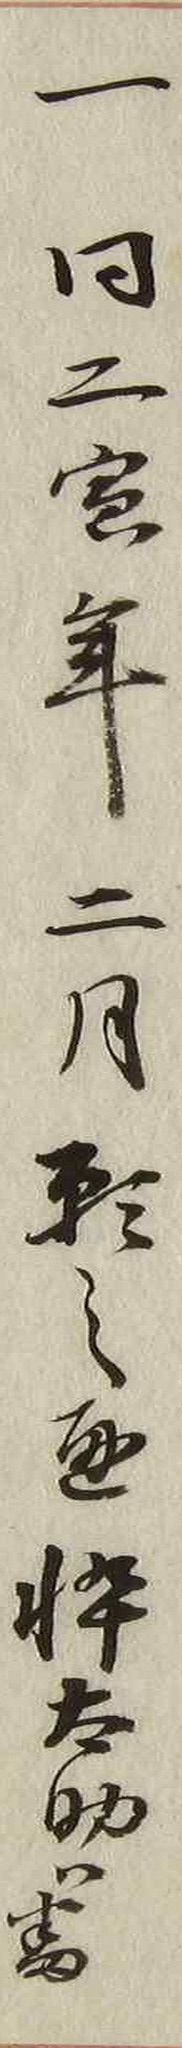一同二寅年二月願い之通り倅太助御番
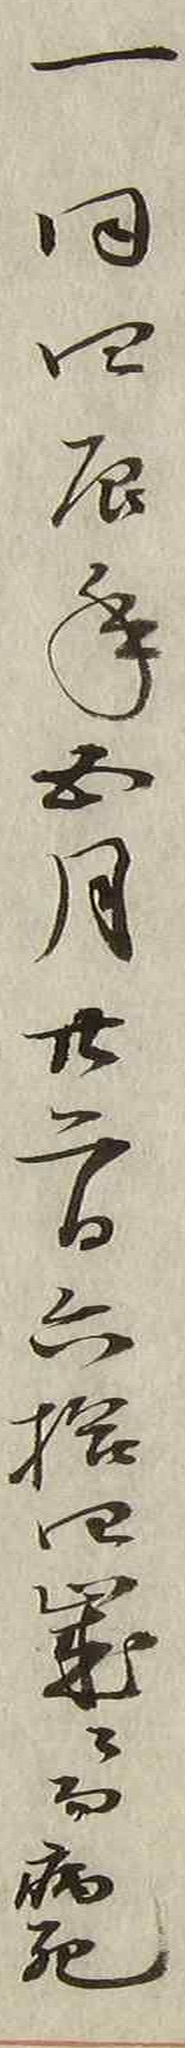一同四辰年五月廿二日六拾四歳ニて病死
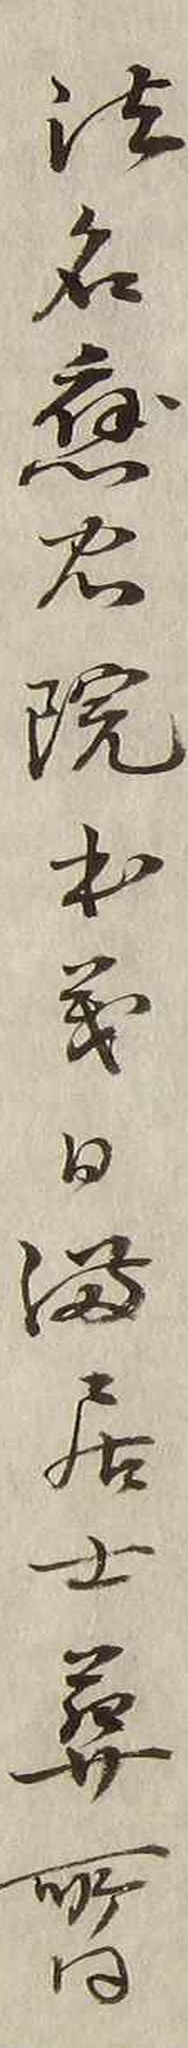法名往忠院本義日満居士葬所同
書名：諸士系譜　巻之16　い之部16
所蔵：会津若松市立会津図書館
